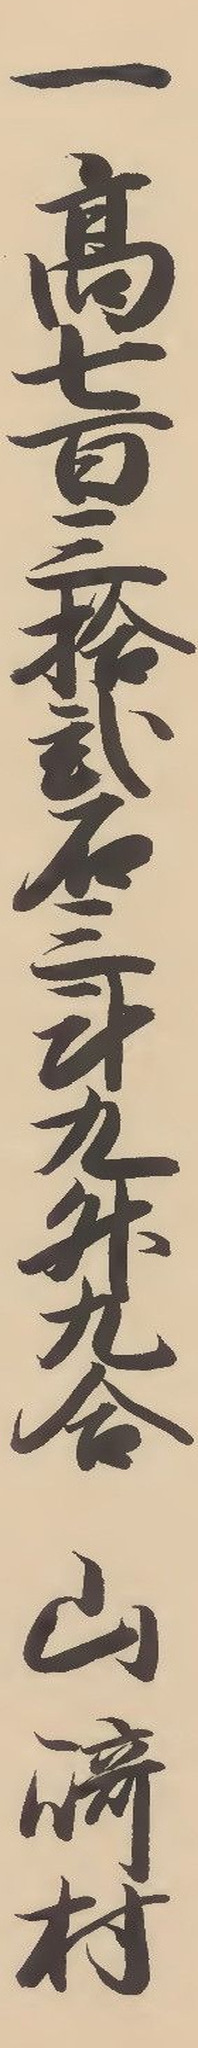一高七百三拾弐石三斗九升九合山崎村
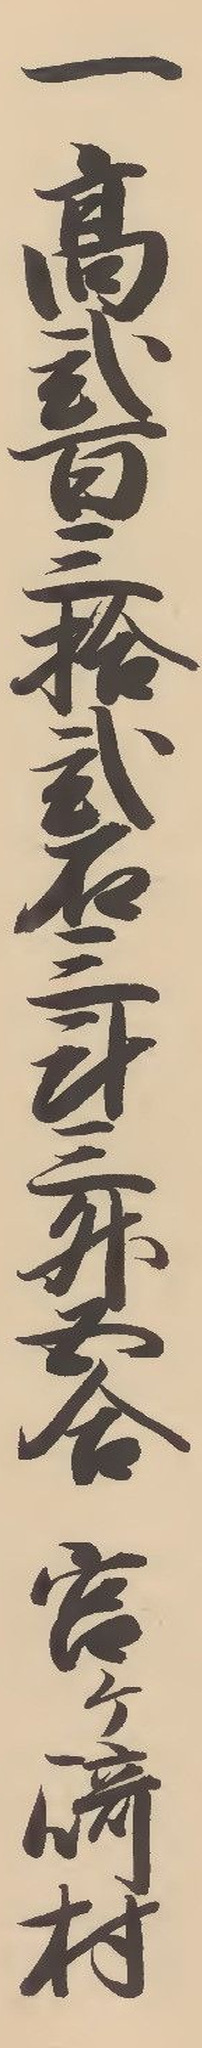一高弐百三拾弐石三斗三升五合宮ヶ崎村
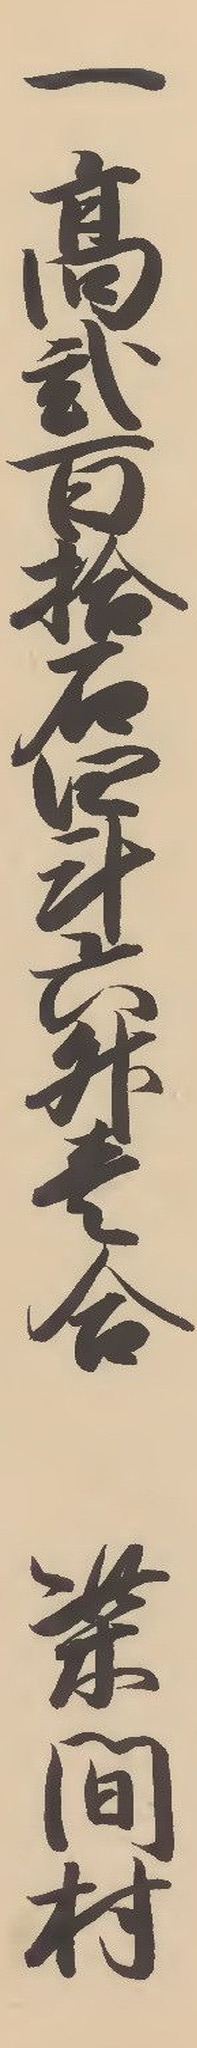一高弐百拾石四斗六升壱合柴間村

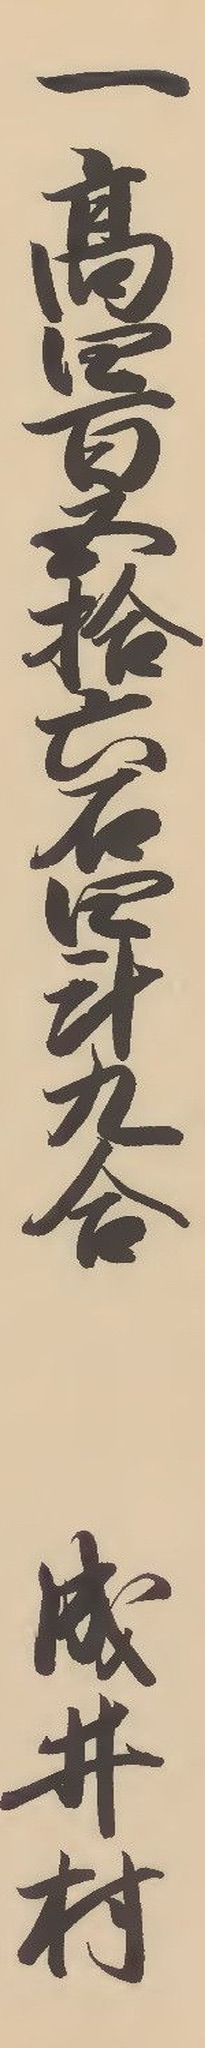一高四百五拾六石四斗九合成井村
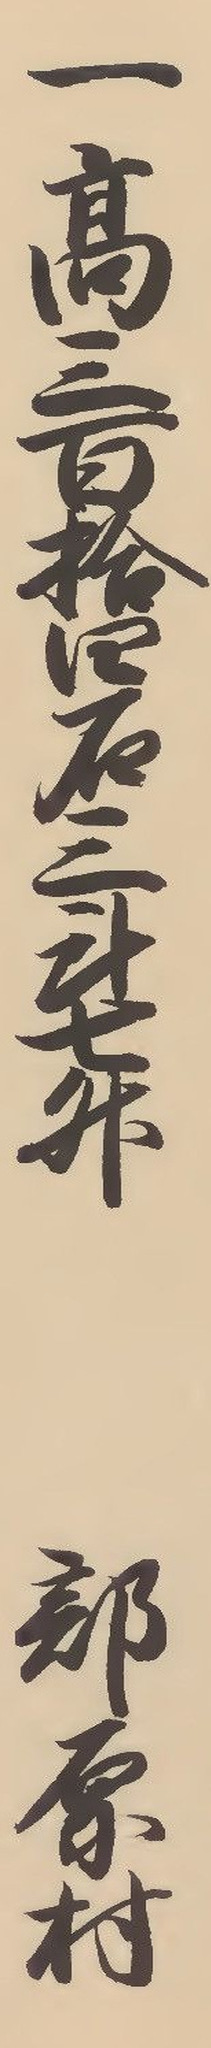一高三百拾四石三斗七升部原村
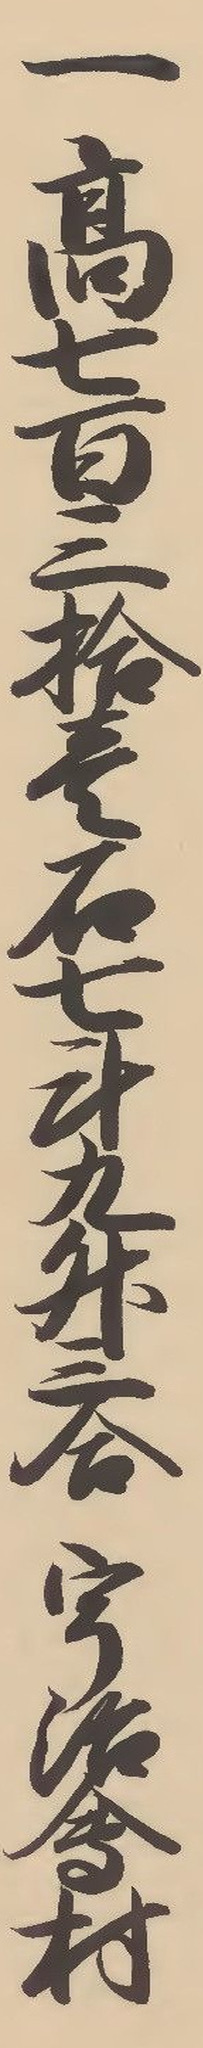一高七百三拾壱石七斗九升三合宇治会村
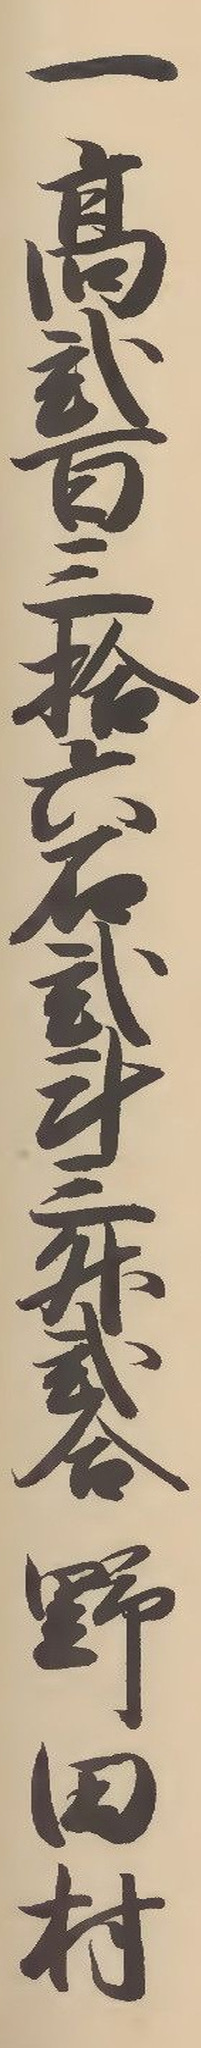一高弐百三拾六石弐斗三升弐合野田村
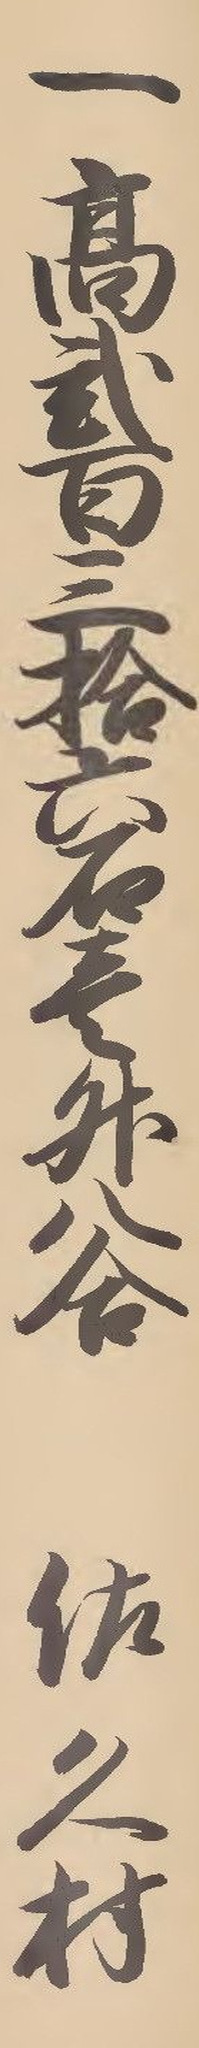一高弐百三拾六石壱升八合佐久村
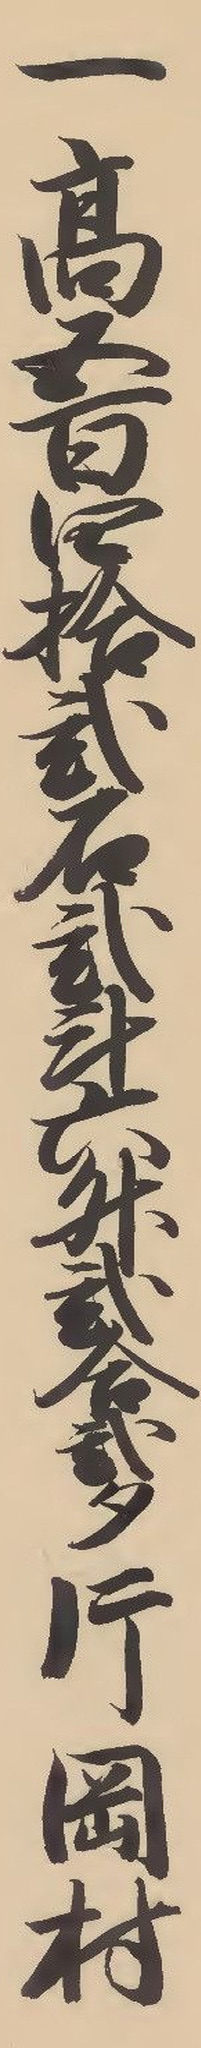一高五百四拾弐石弐斗六升弐合弐勺片岡村
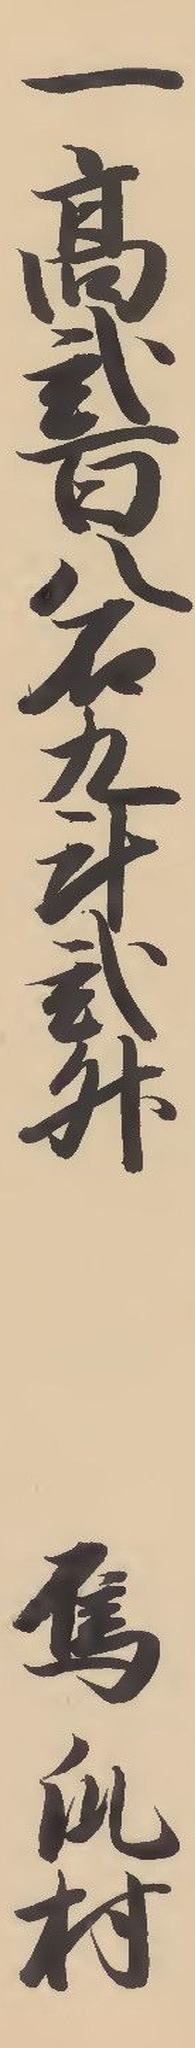一高弐百八石九斗弐升烏瓜村
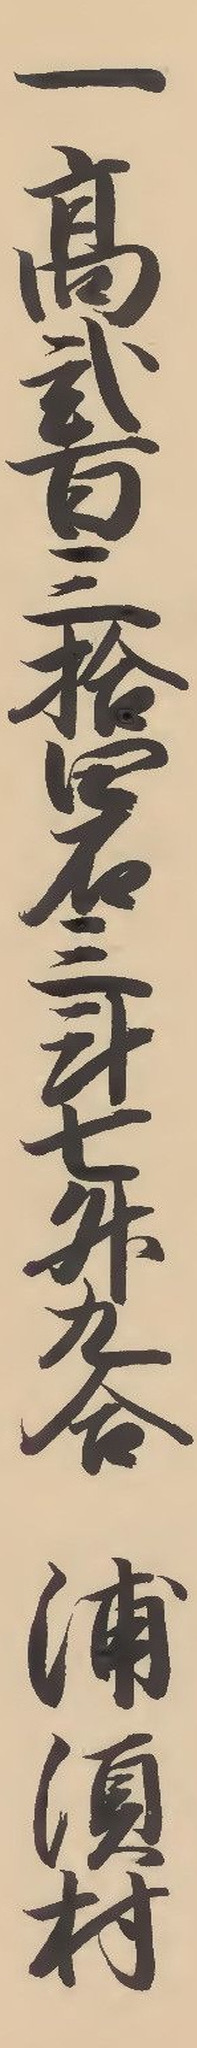一高弐百三拾四石三斗七升九合浦須村

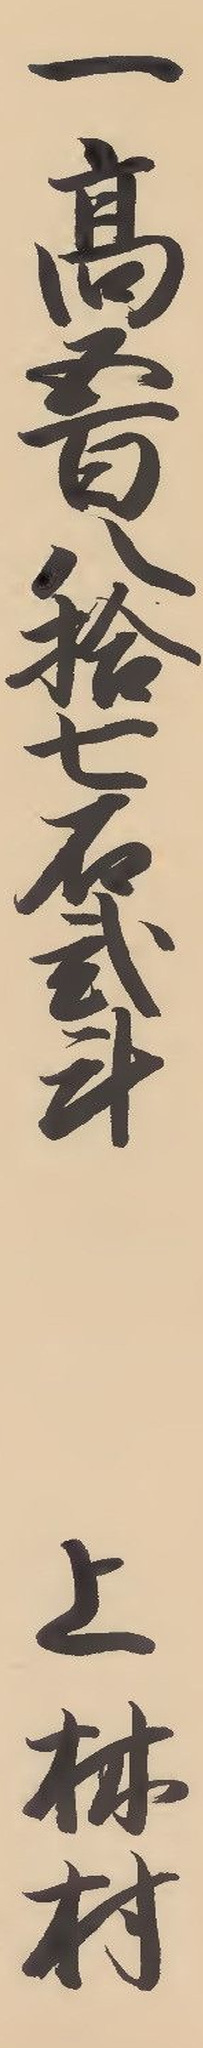一高五百八拾七石弐斗上林村
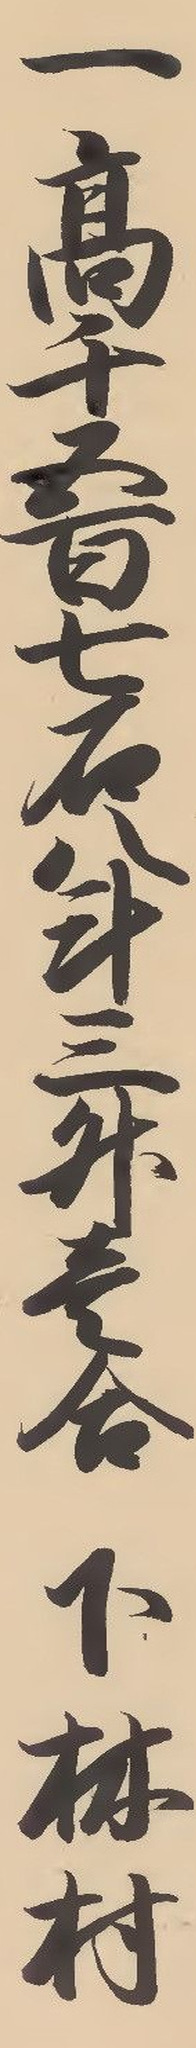一高千五百七石八斗三升壱合下林村
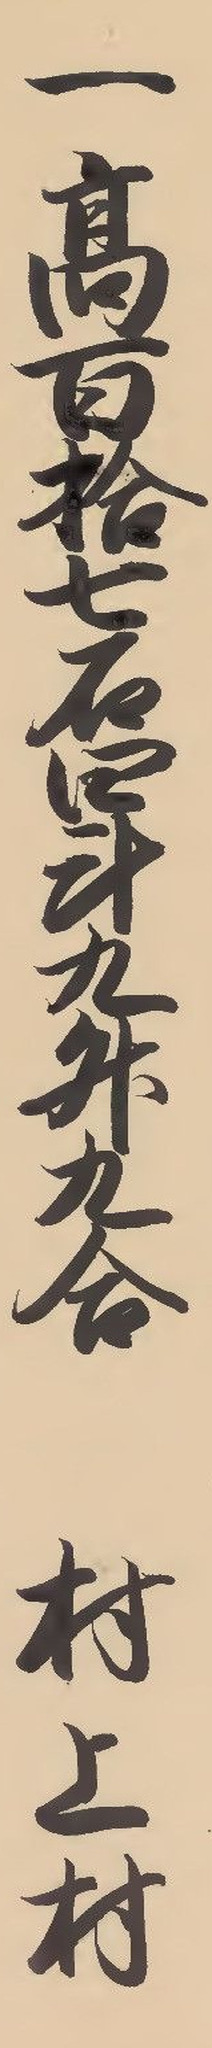一高百拾七石四斗九升九合村上村
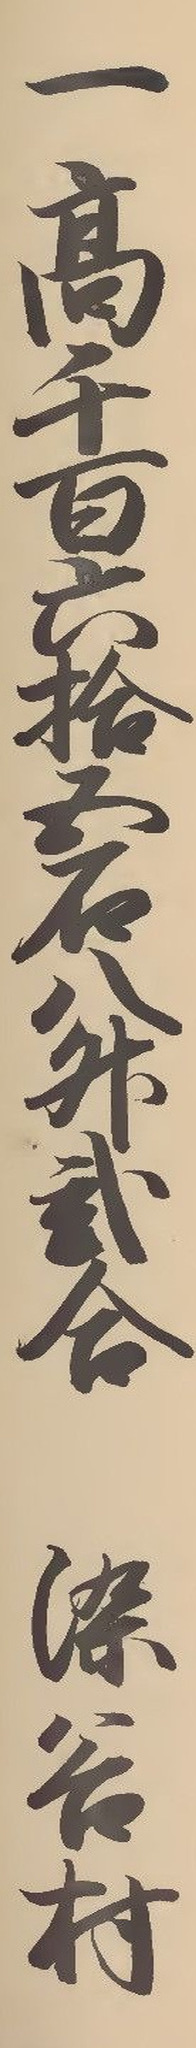一高千百六拾五石八升弐合染谷村
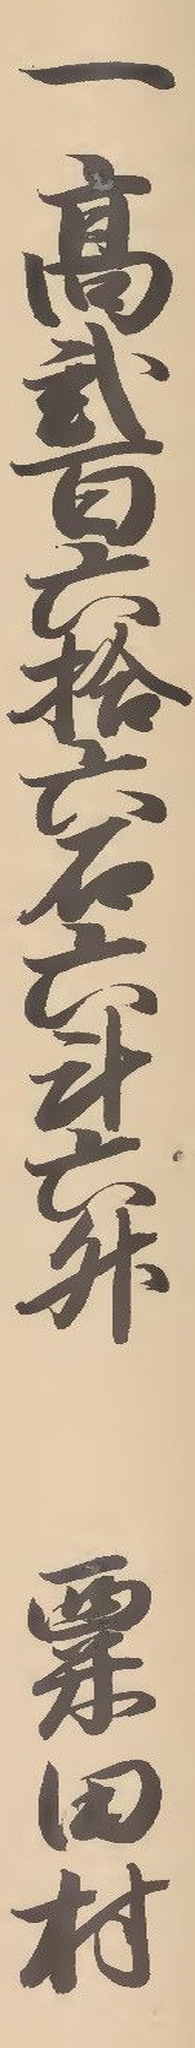一高弐百六拾六石六斗六升粟田村
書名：常陸国郷帳
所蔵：国立公文書館 National Archives of Japan
